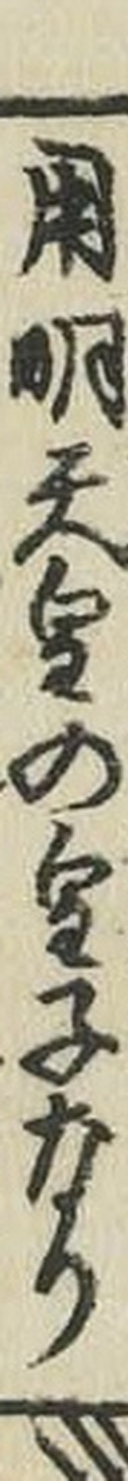用明天皇の皇子なり
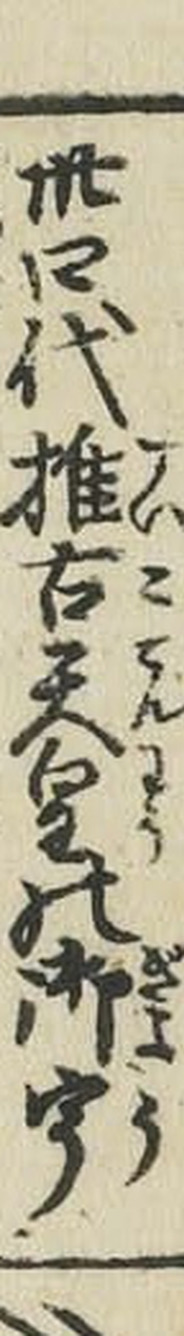丗四代推古天皇の御宇
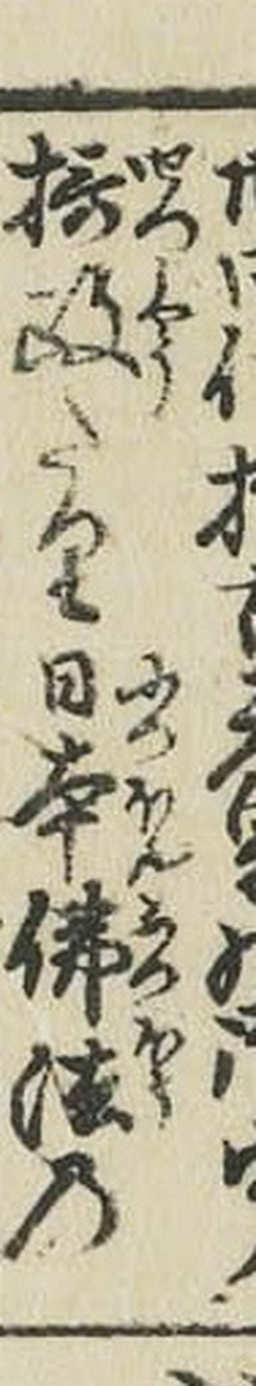摂政たり日本仏法の
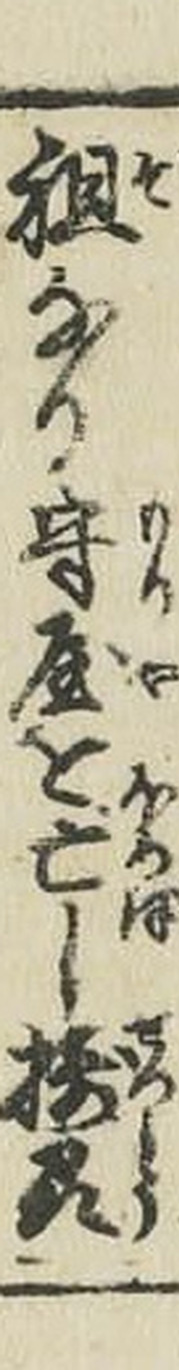祖なり守屋を亡し摂州
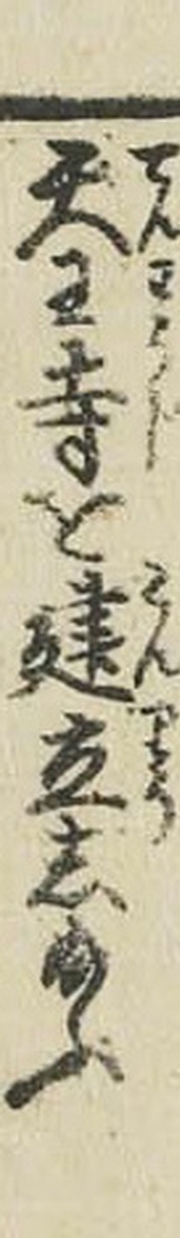天王寺を建立し給ふ
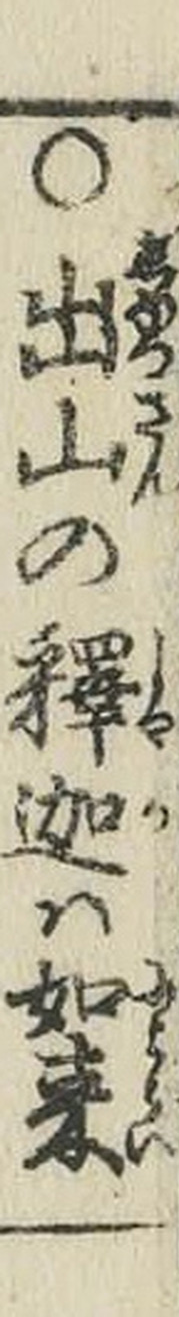○出山の釈迦は如来
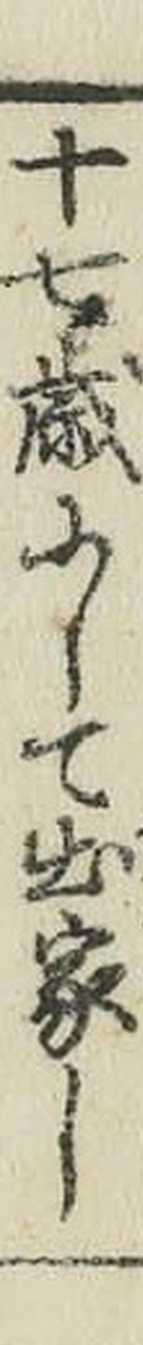十七歳にして出家し
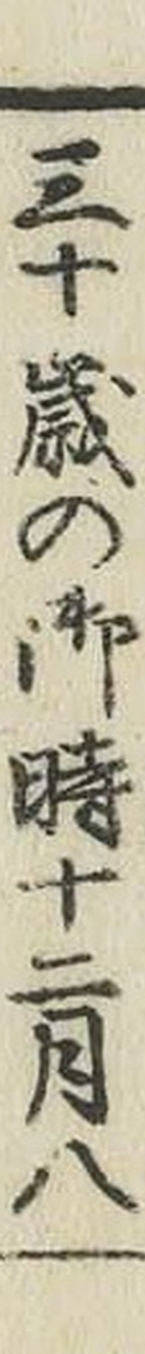三十歳の御時十二月八
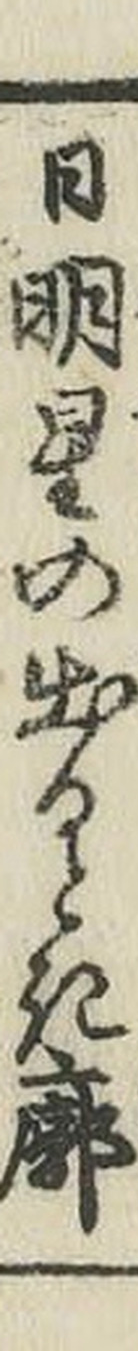日明星の出るとき廓
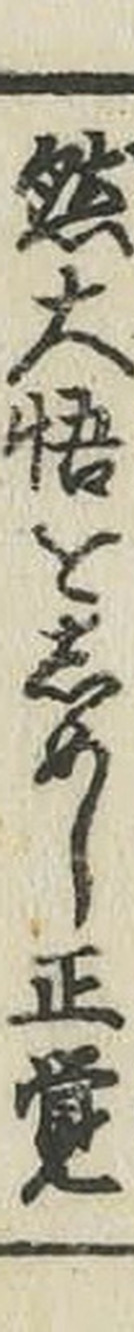然大悟をしめし正覚
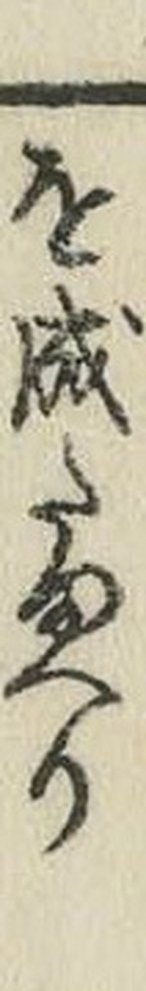を成たまへり
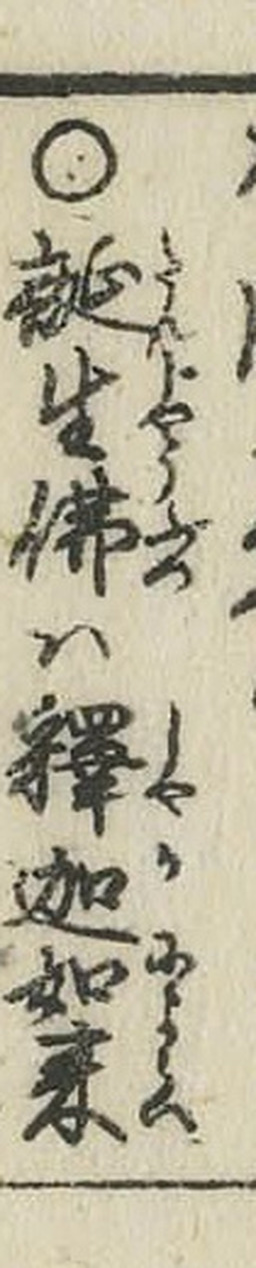○誕生仏は釈迦如来
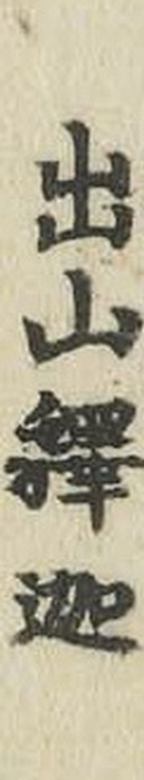出山釈迦
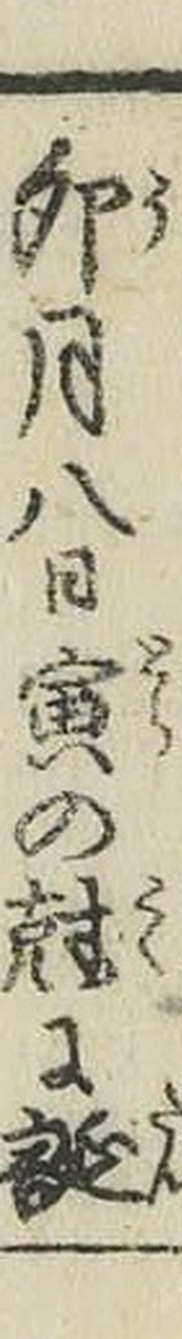卯月八日寅の剋に誕
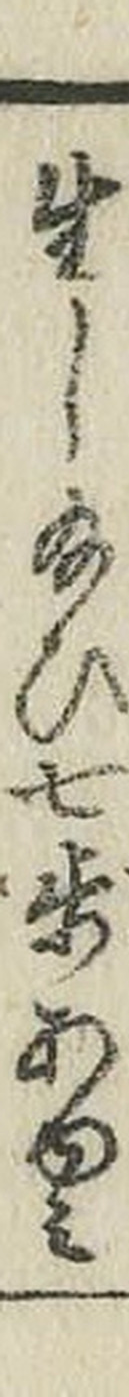生し給ひ七歩あゆみ
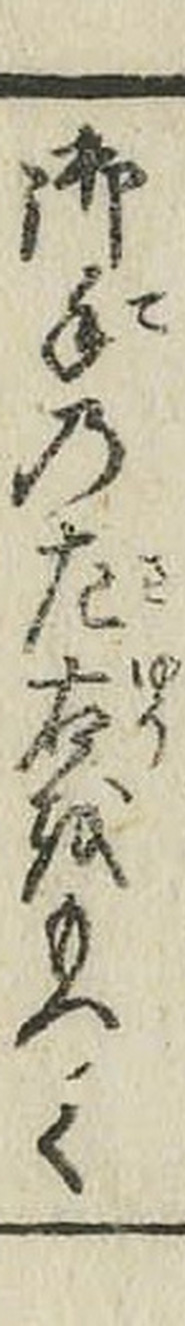御手の左右をもつて
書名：増補頭書訓蒙図彙大成 10巻 10:巻之21
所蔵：東京学芸大学教育コンテンツアーカイブ
